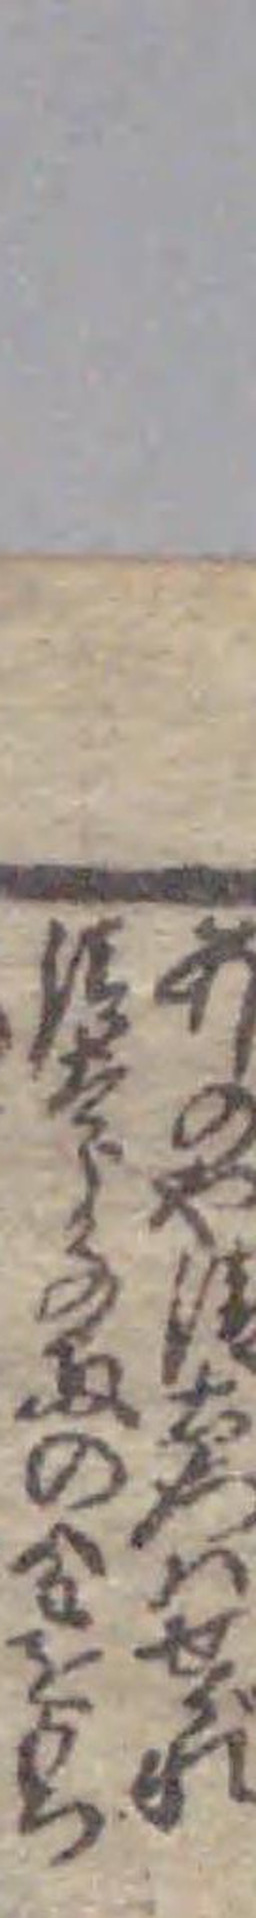清太郎千両の金をもち
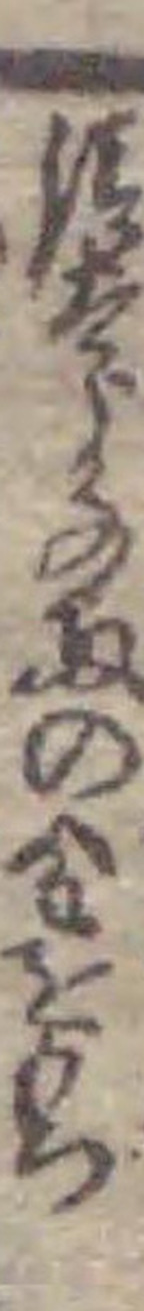清太郎千両の金をもち
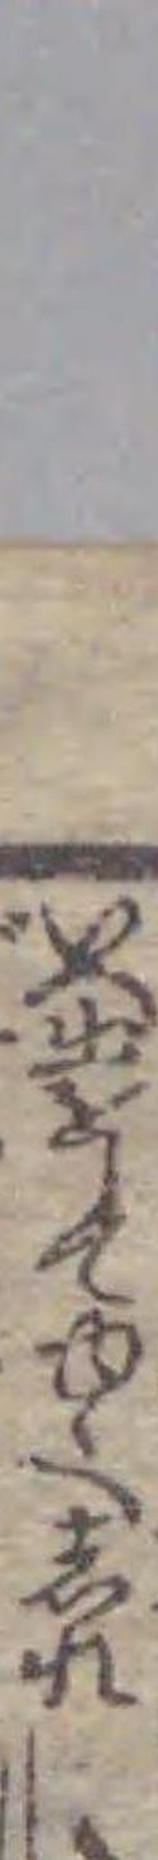いへ出をしてゆくへしれ
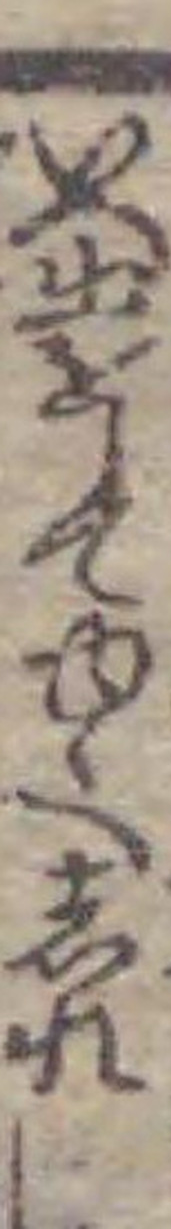いへ出をしてゆくへしれ
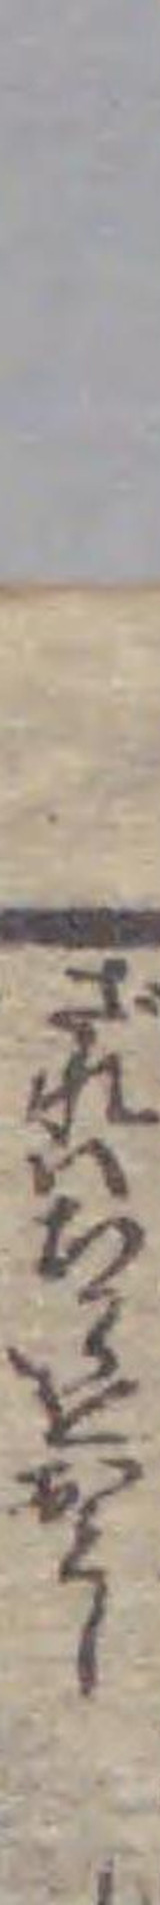ざれはちからをおとし
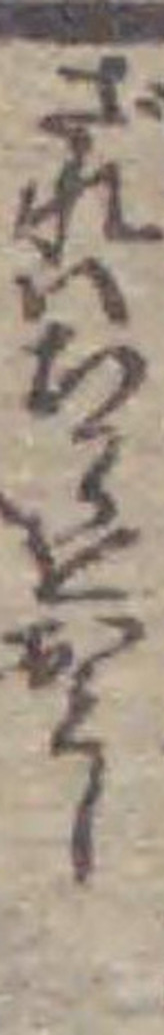ざれはちからをおとし
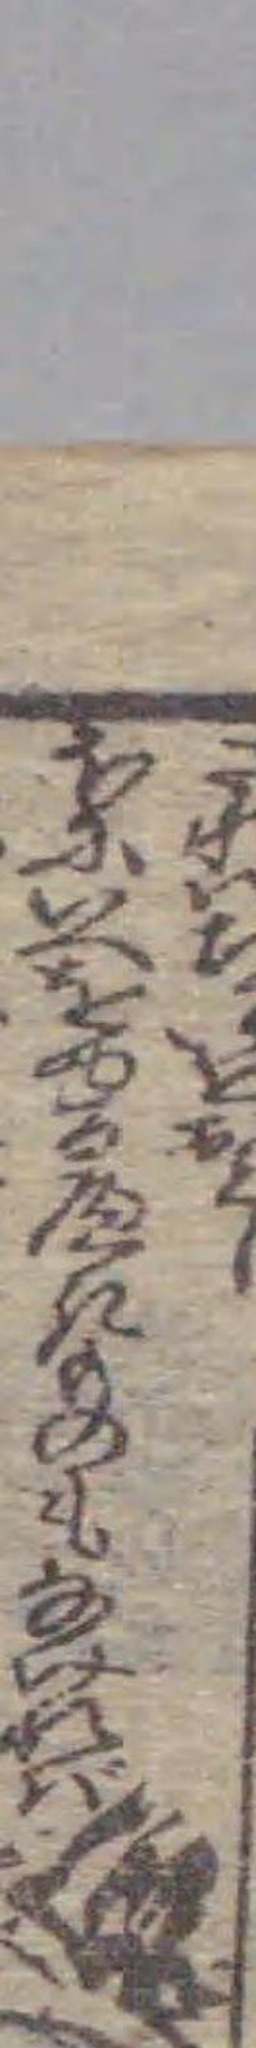外にいへをゆるへきものもなければ
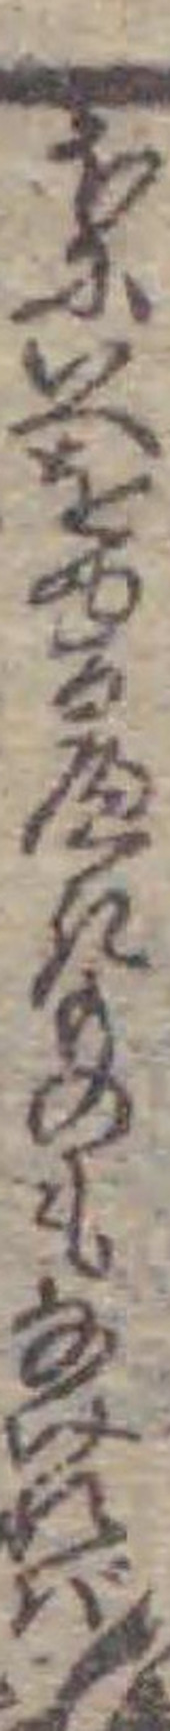外にいへをゆるへきものもなければ
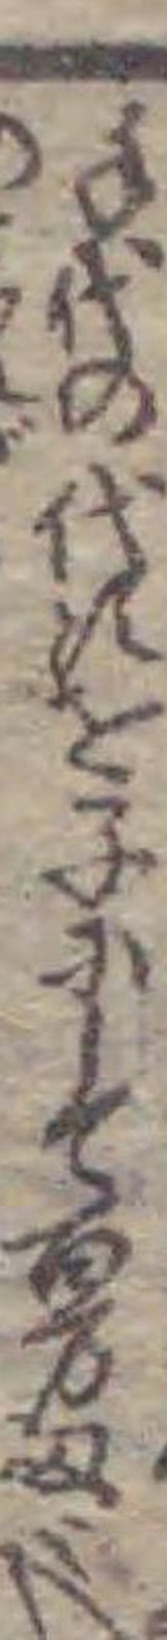手代の代次を子にして百万両
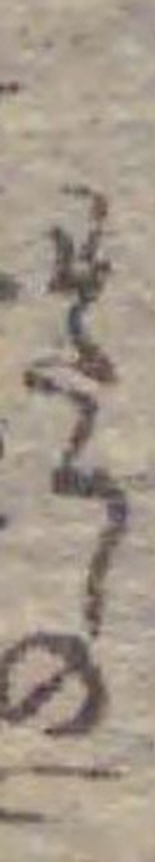わたくしの
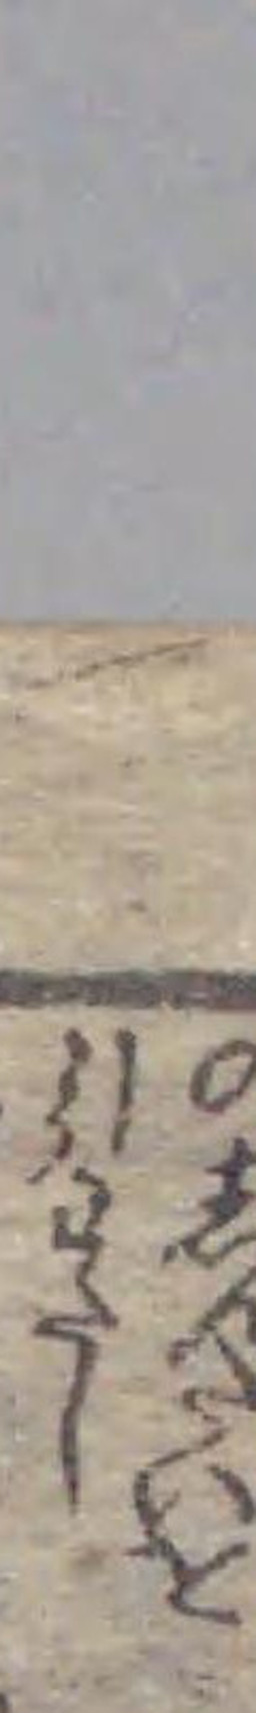引わたし
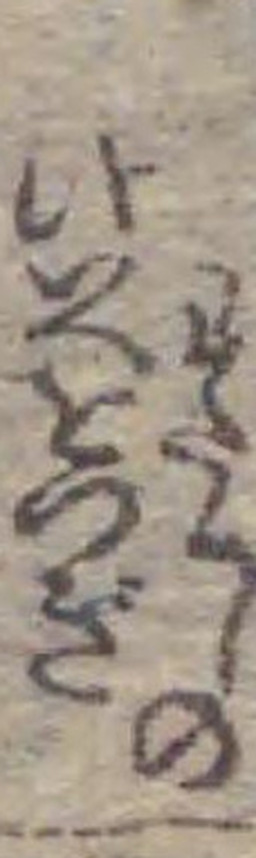此いへをつぎ
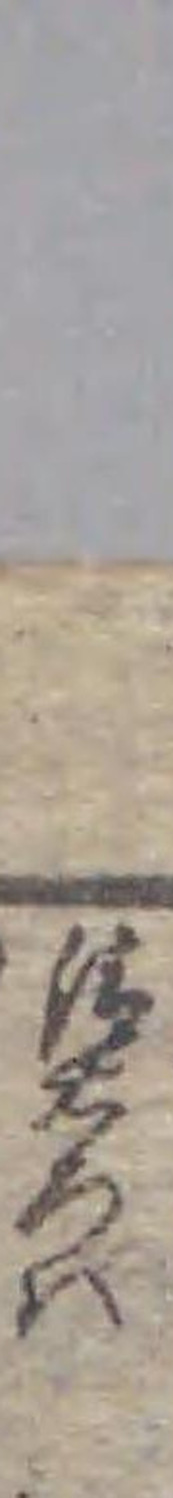清右衛門は
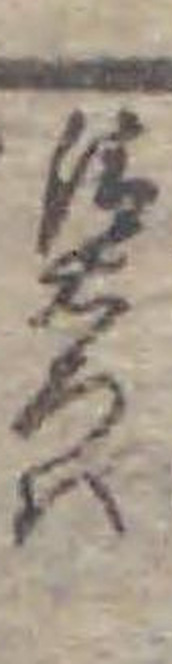清右衛門は
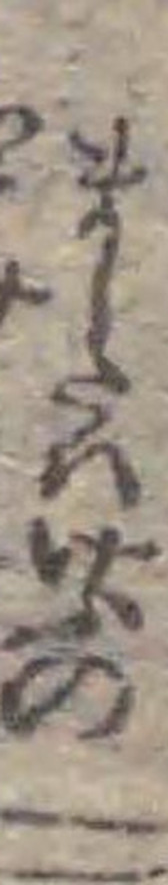ましたはけふの
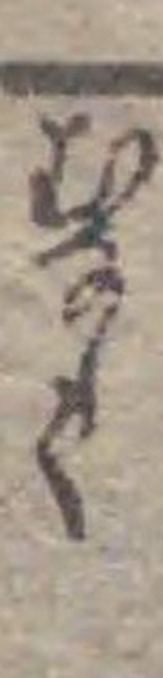むなしく
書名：見徳一炊夢 : 3巻
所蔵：国立国会図書館 National Diet Library, JAPAN
